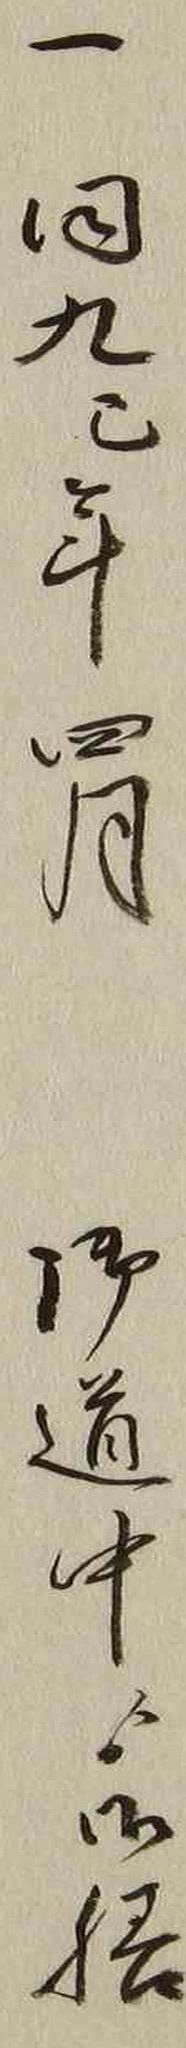一同九巳年四月御道中ゟ御膳
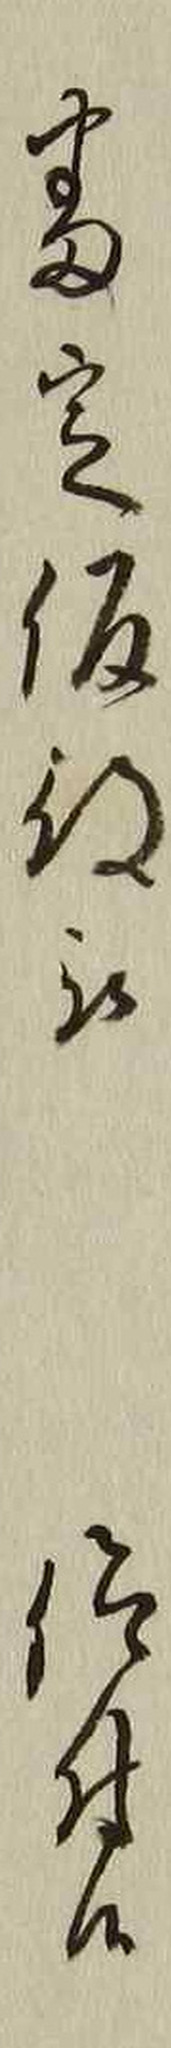番定仮役被仰付候
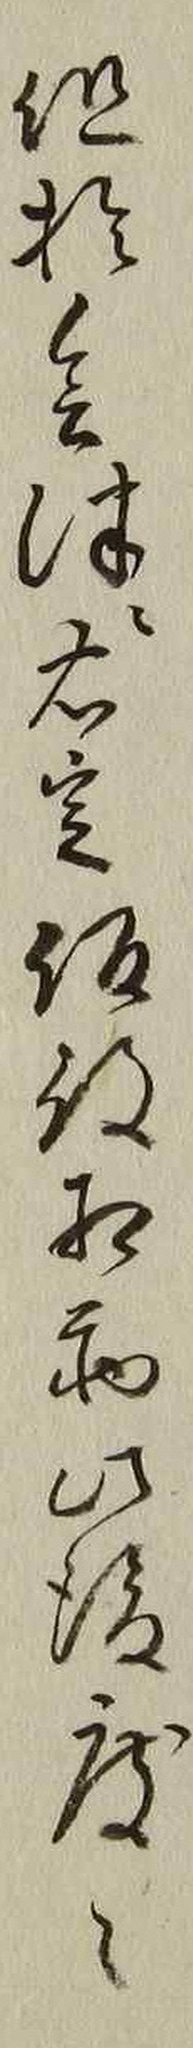但於会津ニ右定仮役相勤此後度々
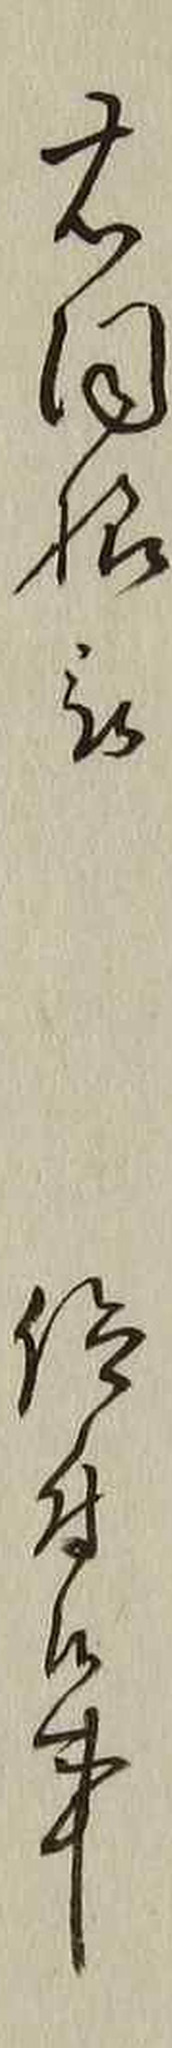右同様被仰付候事
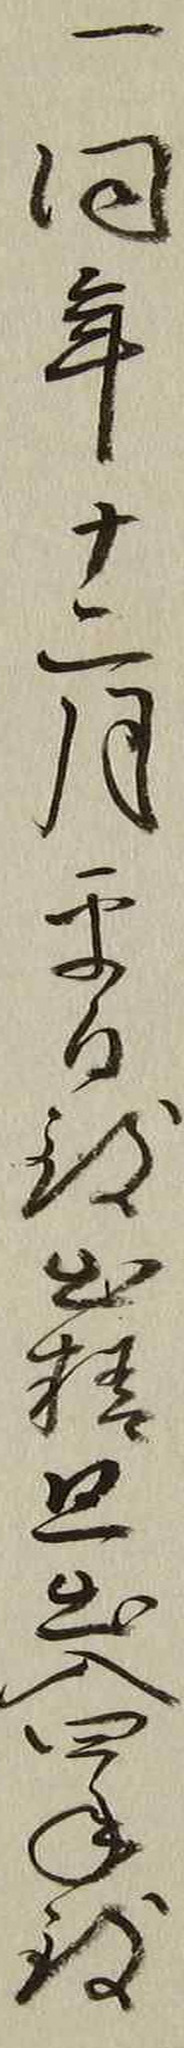一同年十二月平日致出精且出入四年致
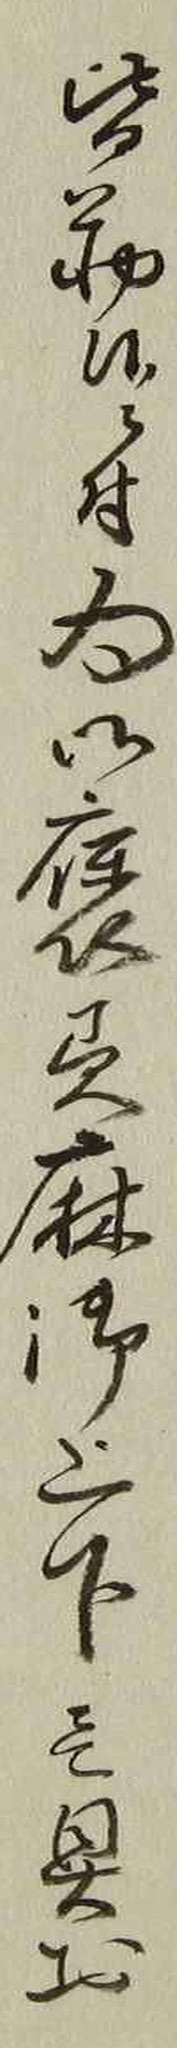皆勤候ニ付為御褒美麻御上下壱具於
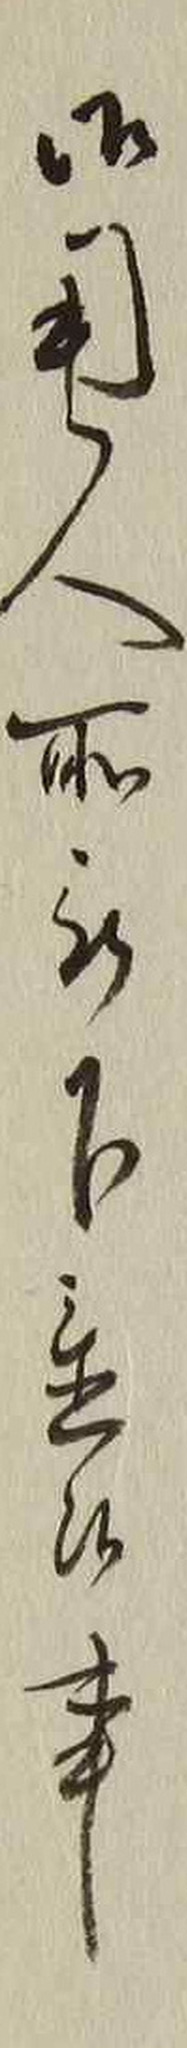御用人所被下置候事
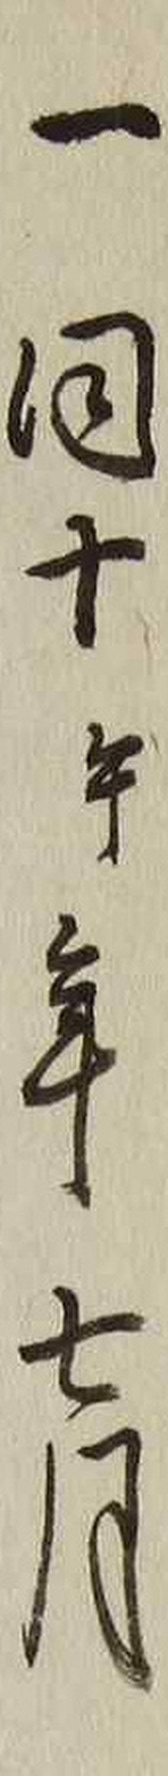一同十午年七月
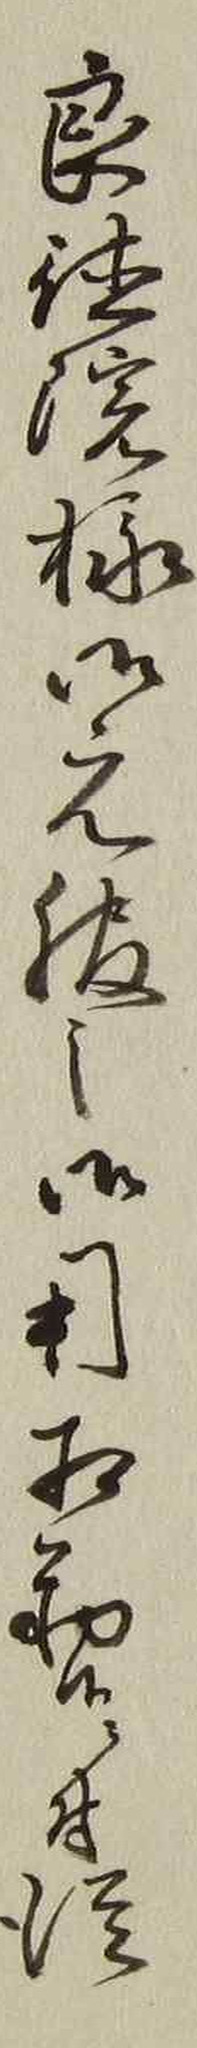良徳院様御元服之御用相勤候ニ付従
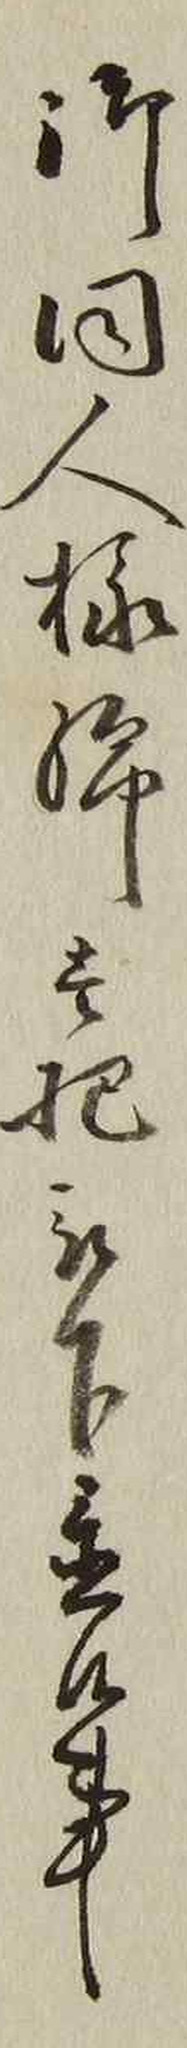御同人様綿壱把被下置候事
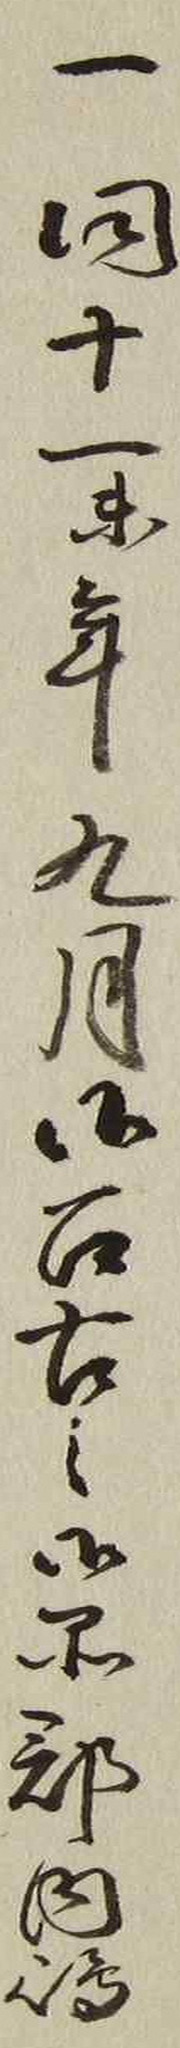一同十一未年九月御召古之御品郡内嶋
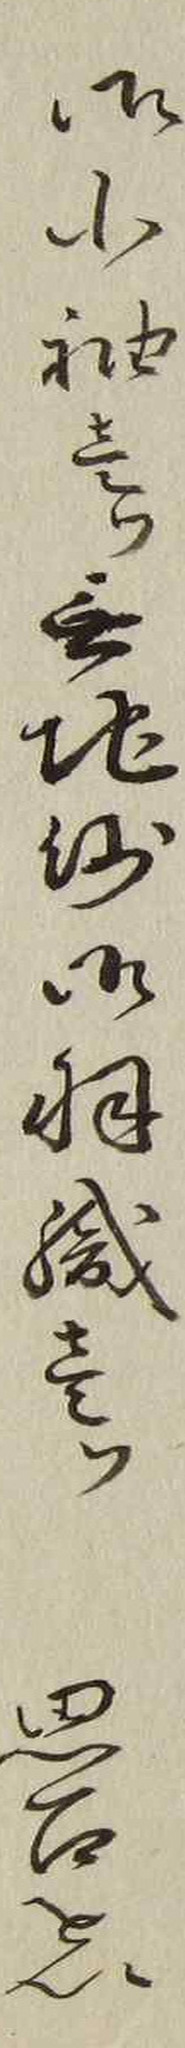御小袖壱ツ無地紗御羽織壱ツ思召を以
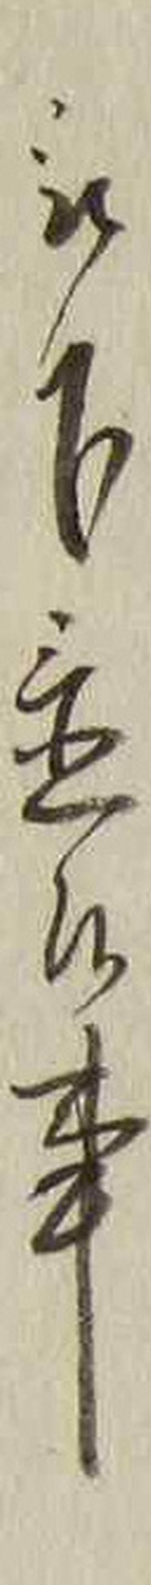被下置候事

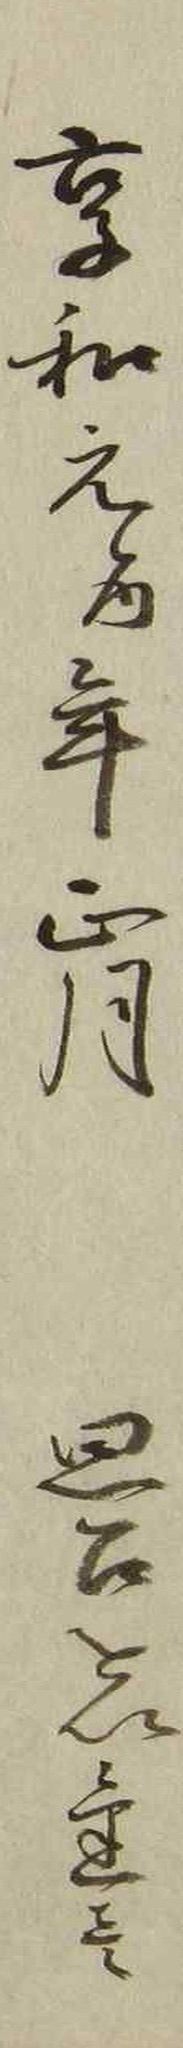享和元酉年正月思召を以金壱
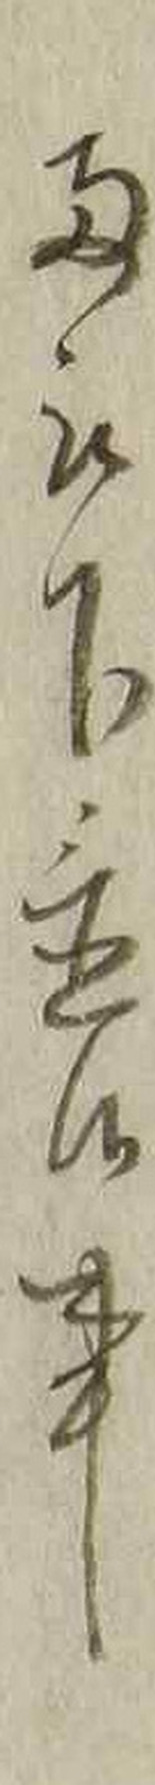両被下置候事
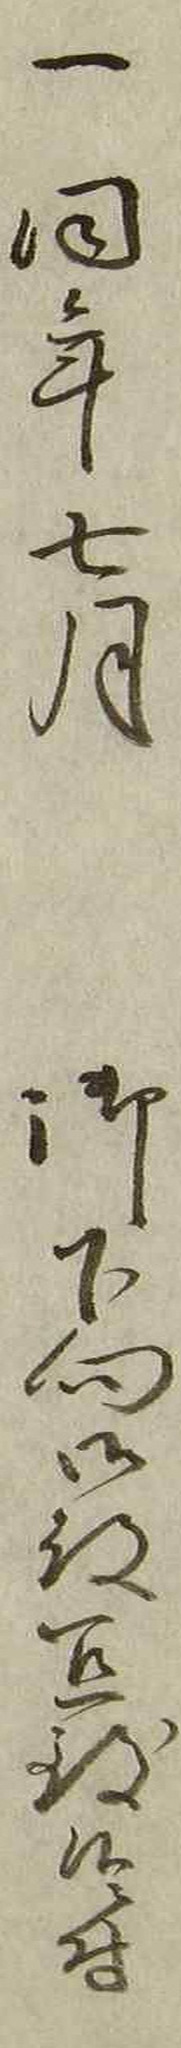一同年七月御下向御役宜致候ニ付
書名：諸士系譜　巻之4　い之部4
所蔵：会津若松市立会津図書館
